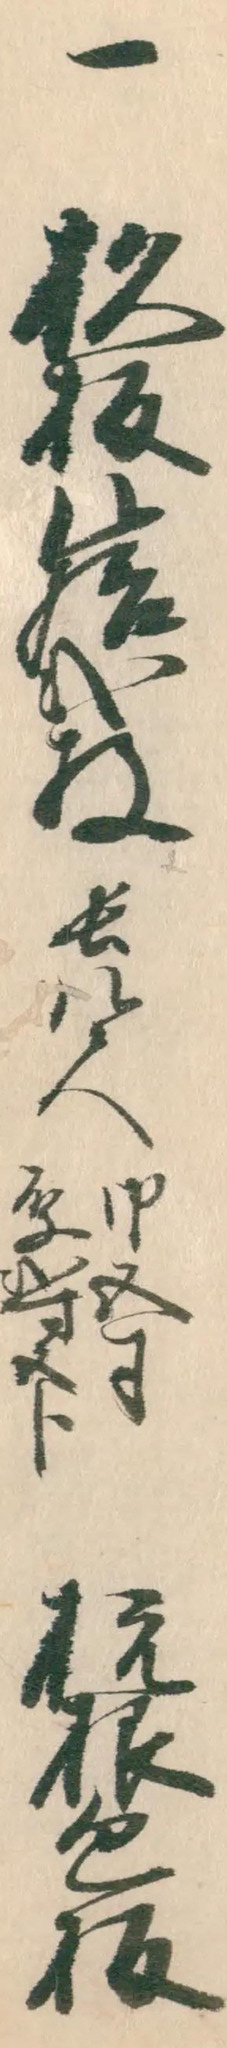一杉板八拾弐枚長八尺巾五寸杭根包板
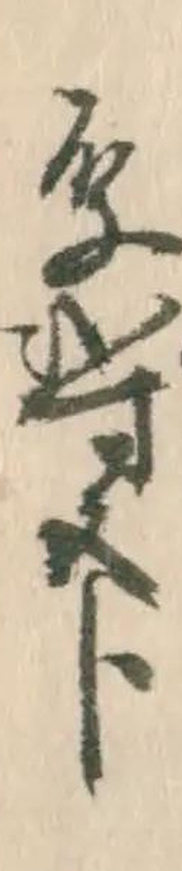厚弐寸五分

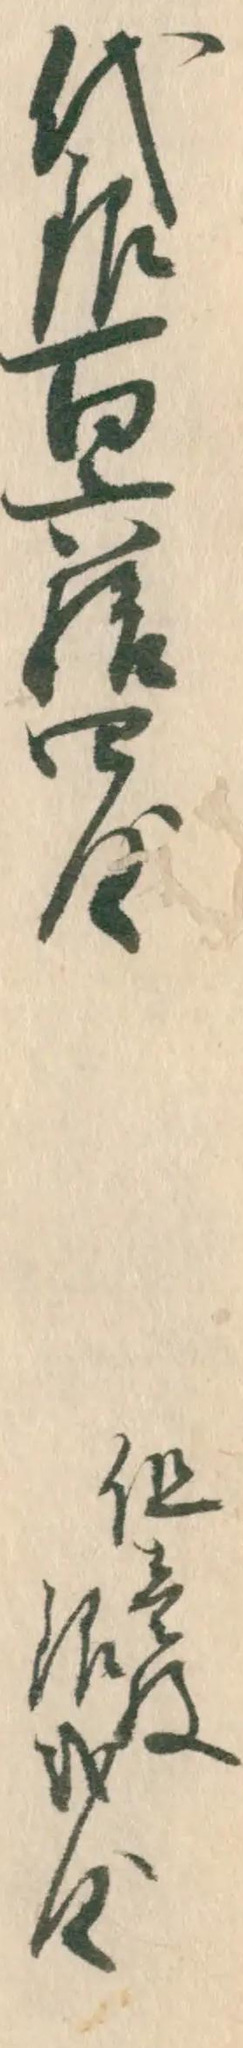代銀百六拾四匁但壱枚銀弐匁
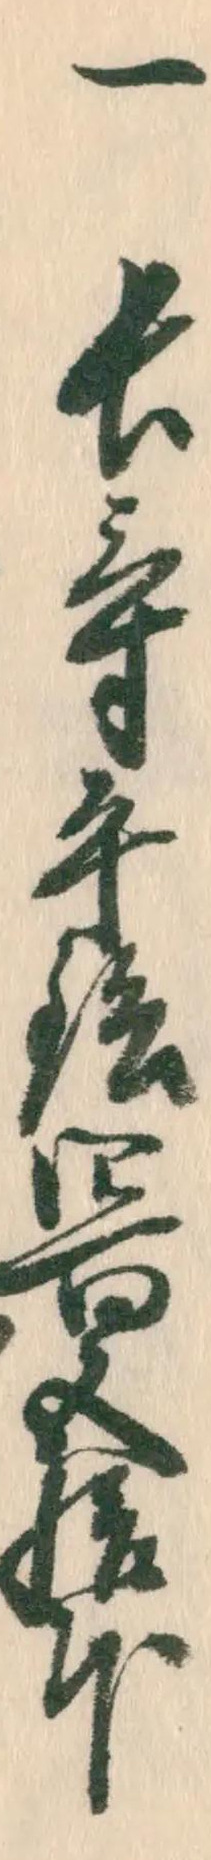一長三寸平鋲四百五拾本
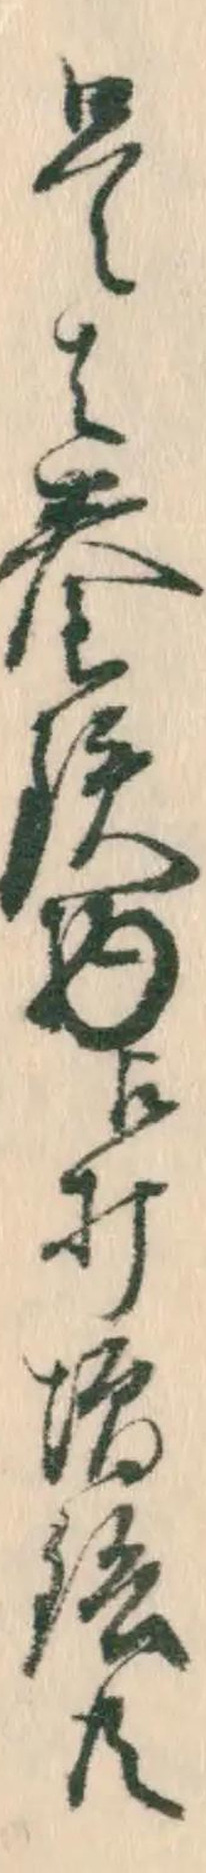是は巻鉄物え打増鋲共
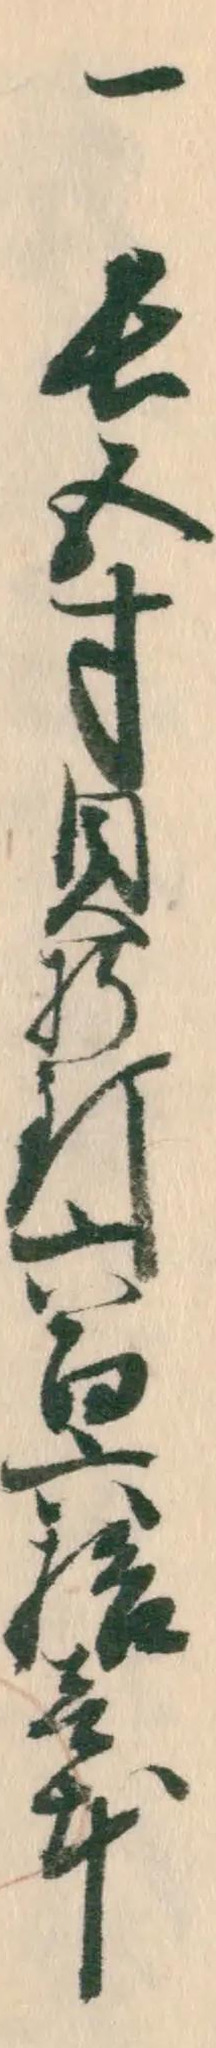一長五寸貝折釘六百六拾壱本
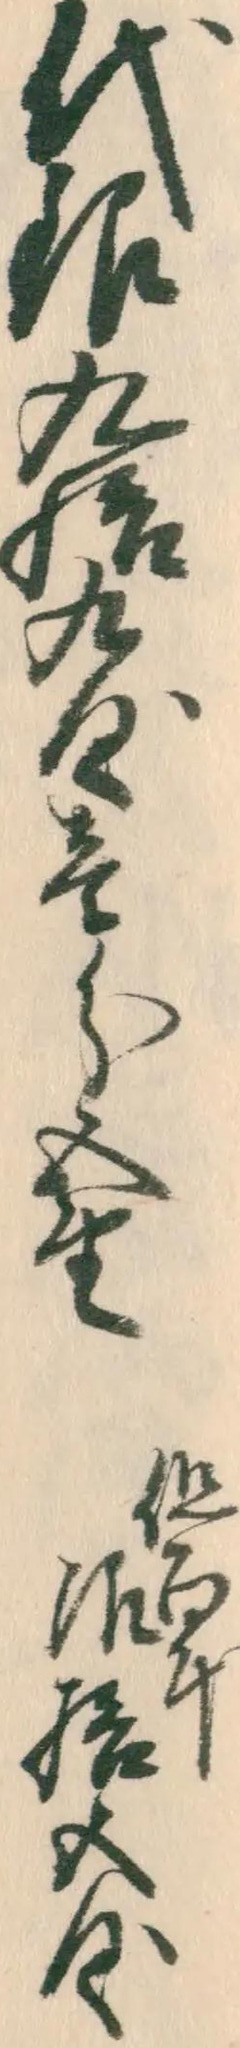代銀九拾九匁壱分五厘但百本銀拾五匁
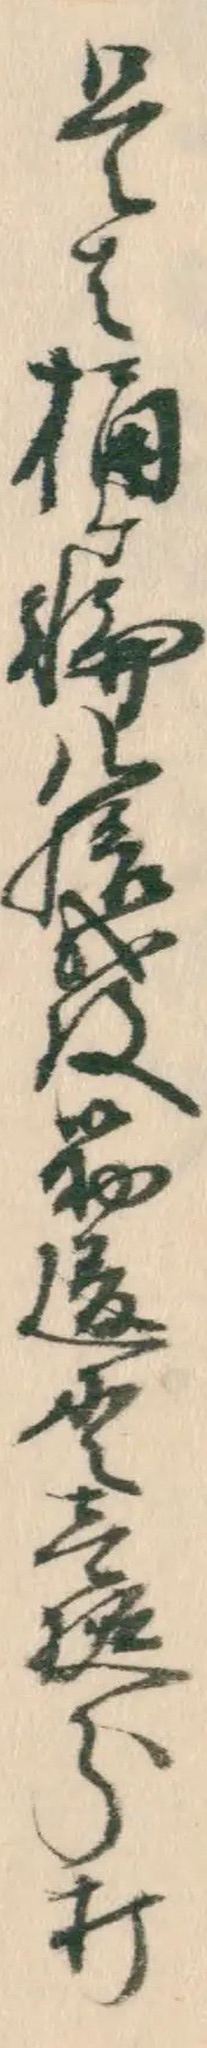是は桶ケ輪八拾弐枚筋違貫壱挺分打
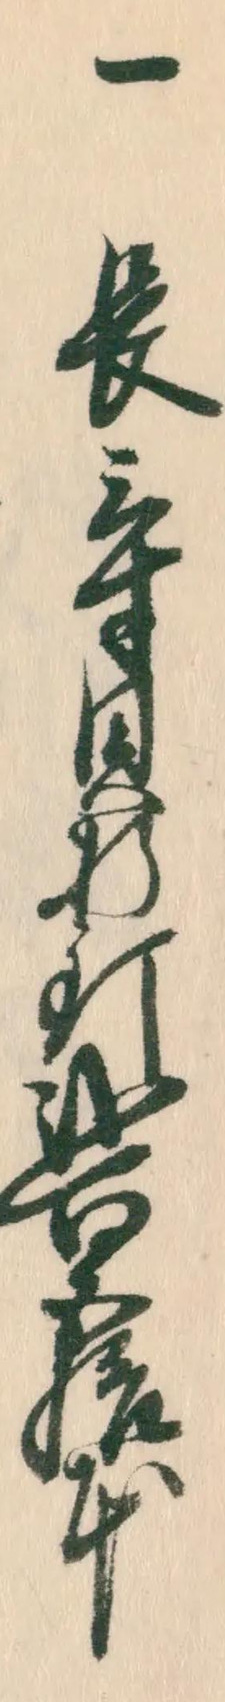一長三寸貝折釘弐百五拾本
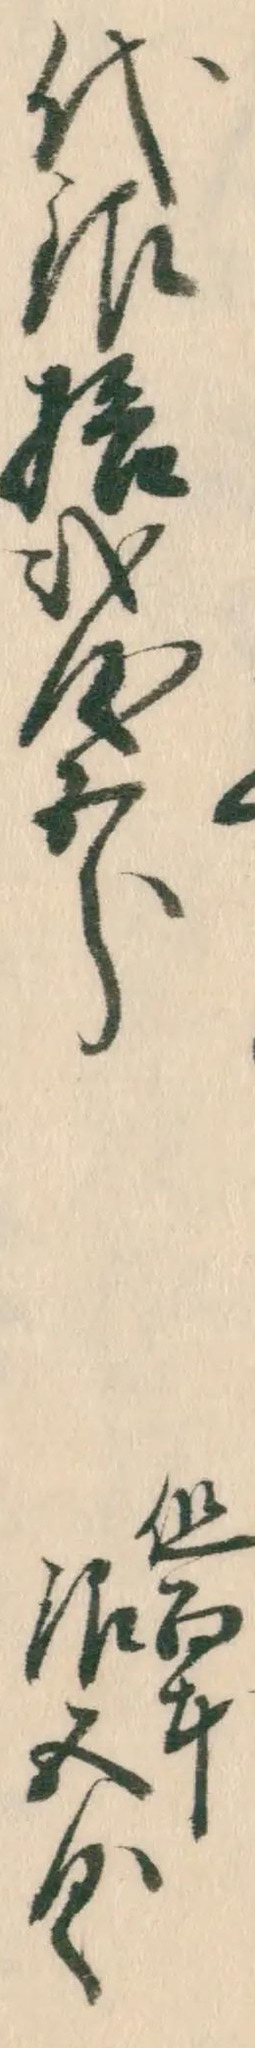代銀拾弐匁五分但百本銀五匁
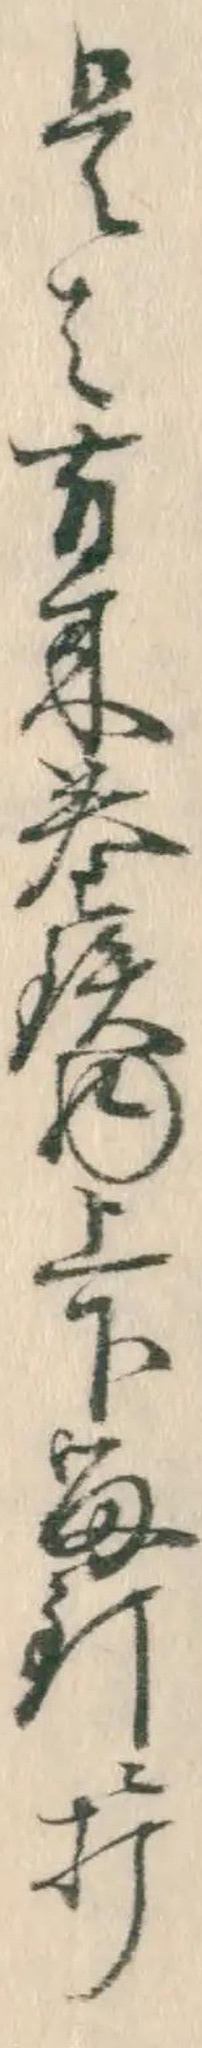是は有来巻鉄物上下留釘ニ打
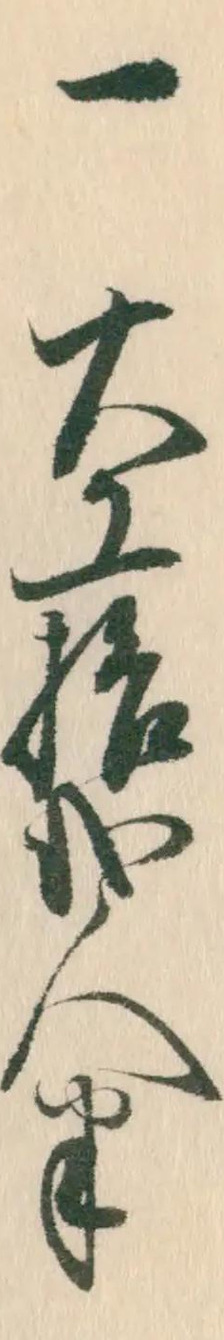一大工拾弐人半
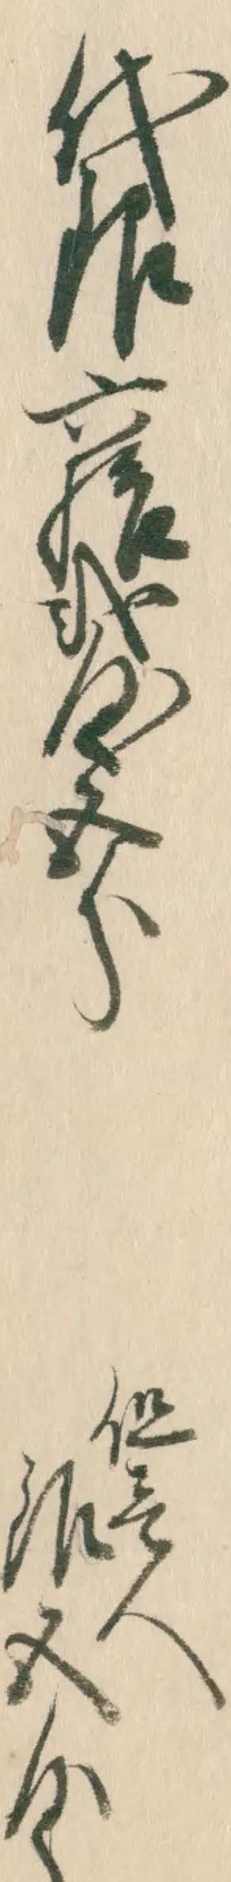代銀六拾弐匁五分但壱人銀五匁

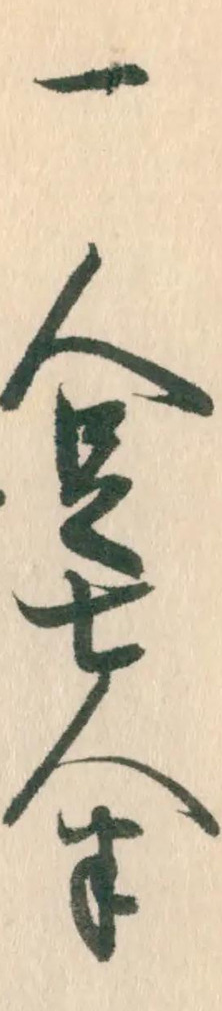一人足七人半
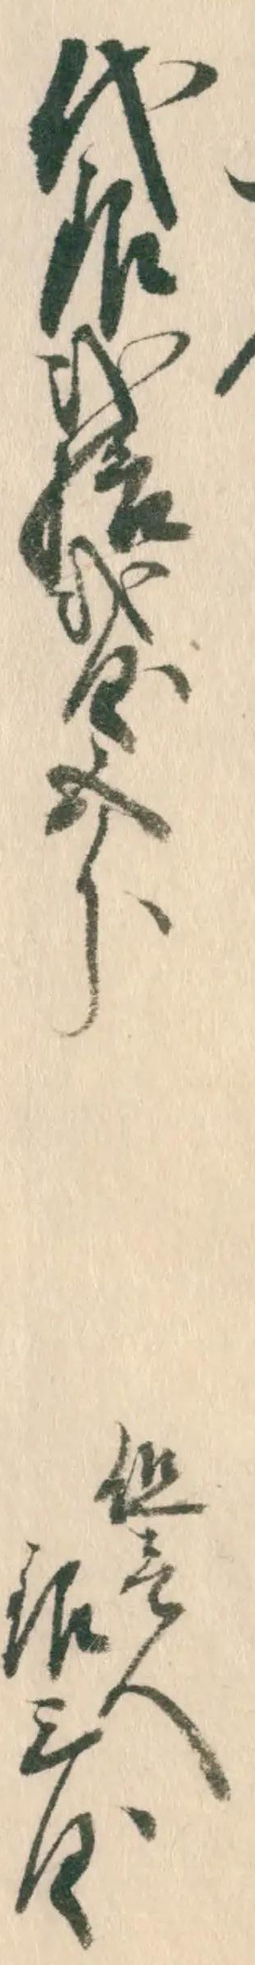代銀弐拾弐匁五分但壱人銀三匁
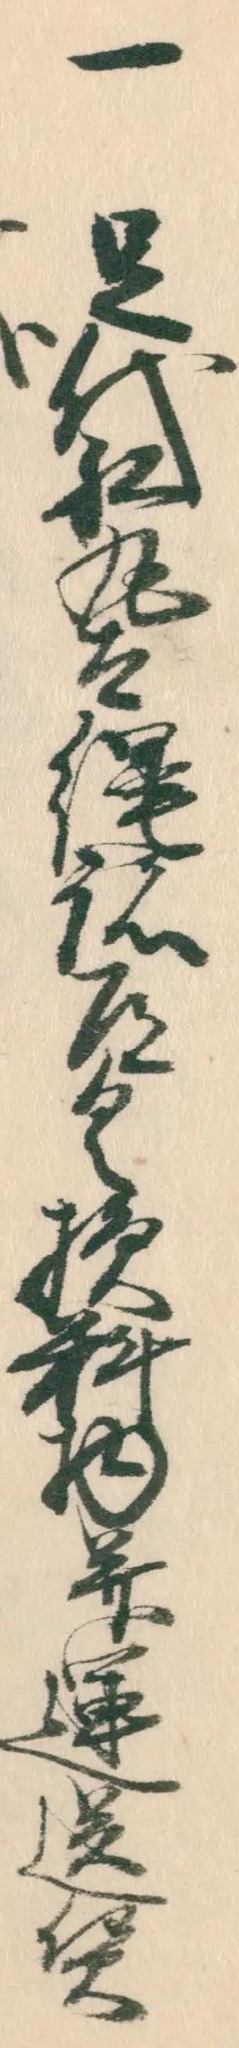一足代船丸太縄諸道具損料物并運送賃
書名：三橋 17巻. [8] 三橋小破御修復書留　但御奉行御掛リ替地震潰橋番屋　嘉永四亥年より安政二卯年迄　下
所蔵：国立国会図書館 National Diet Library, JAPAN
